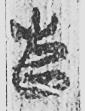{山𡴎}
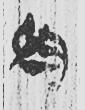於
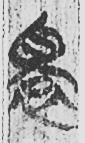睘
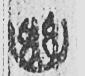幽
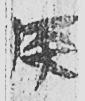侯
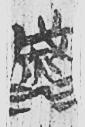滅
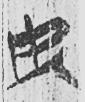𡚦
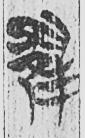翟
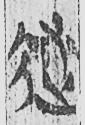述
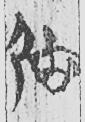居
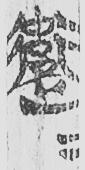衛止=
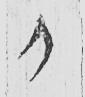人
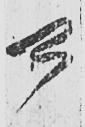乃
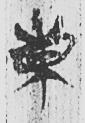東
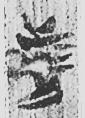涉
